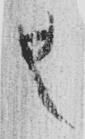也
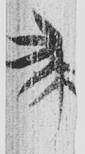求
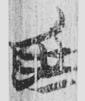爲
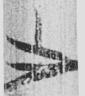之
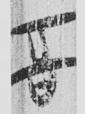言
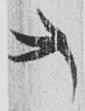又（有）
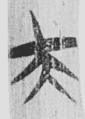夫
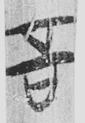言
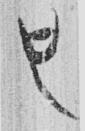也
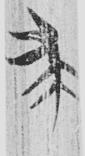求
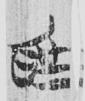爲
